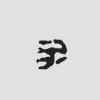司
